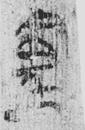飪
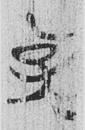孔子
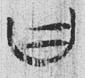曰
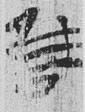唯
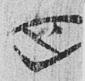正（政）
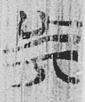者
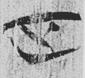正
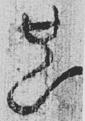也
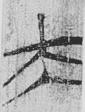夫
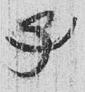子
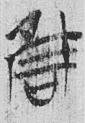唯
